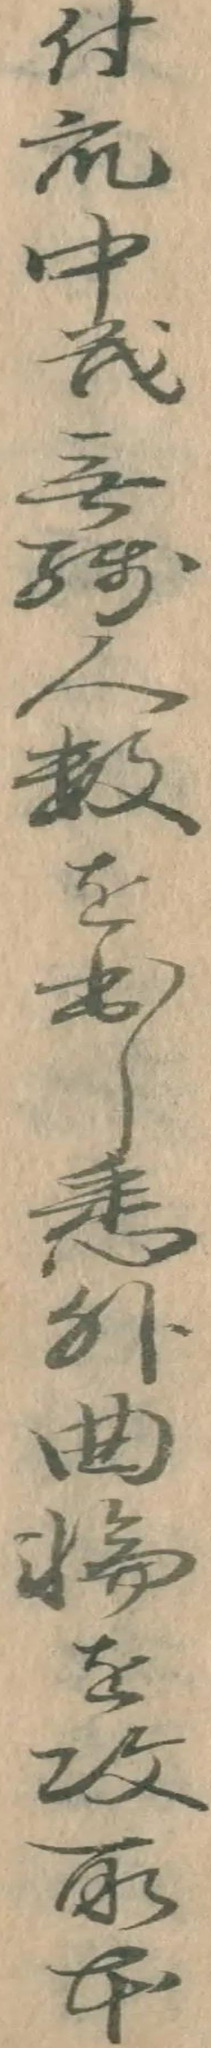付衆中茂無残人数を出し悉外曲輪を攻取本

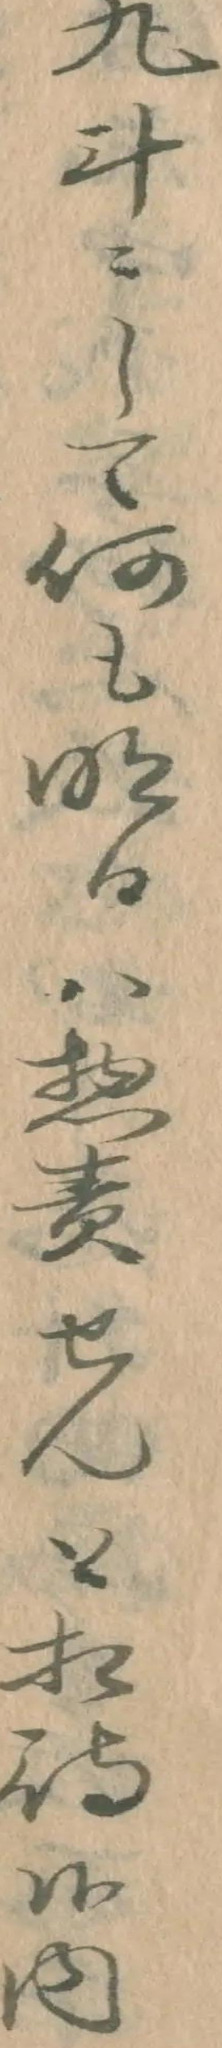丸斗にして何も明日は惣責せんと相待候内
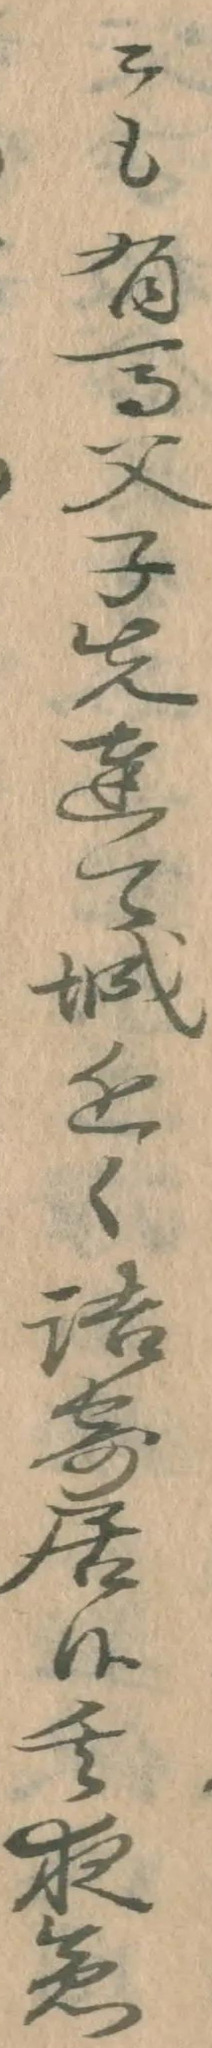にも有馬父子先達て城近く詰寄居候其夜急
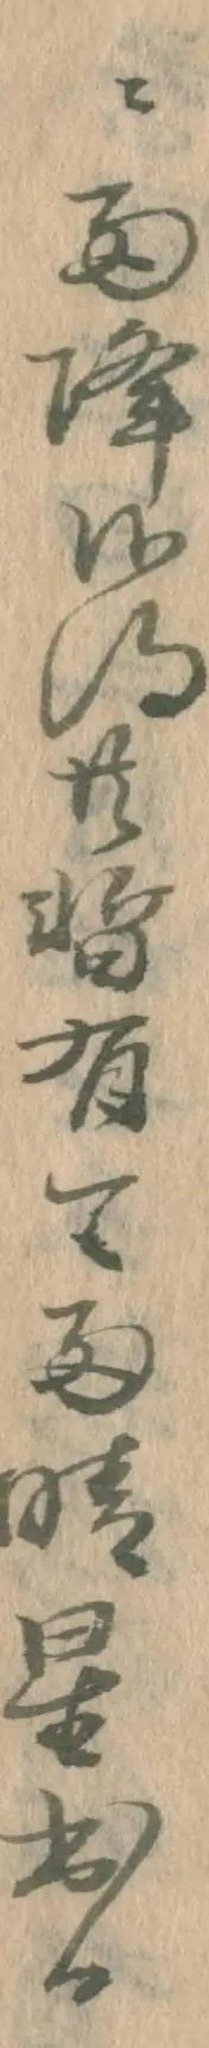に雨降候得共暫有て雨晴星出る
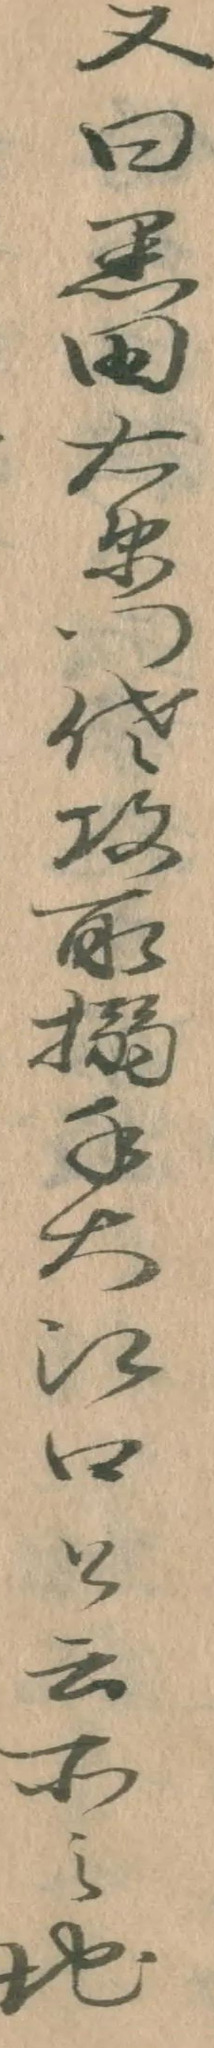又曰黒田右衛門佐攻取搦手大江口と云所之地
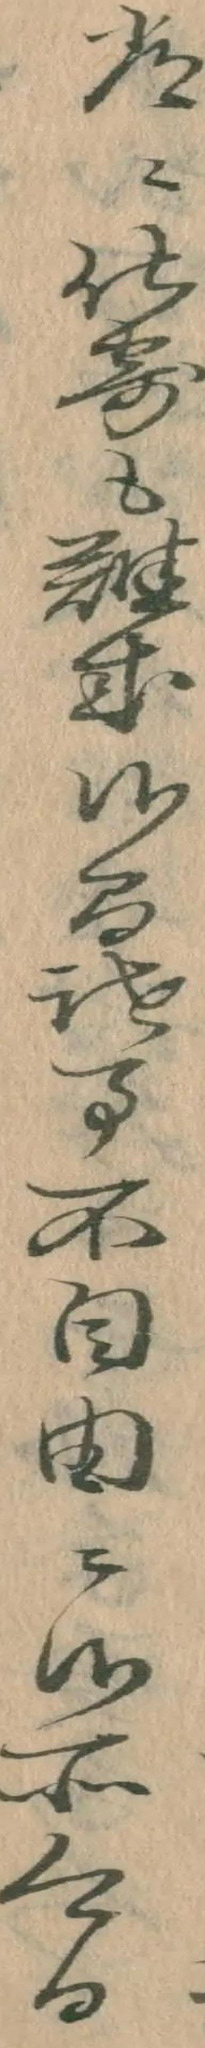常に仕寄も難成候間諸事不自由に候所今日
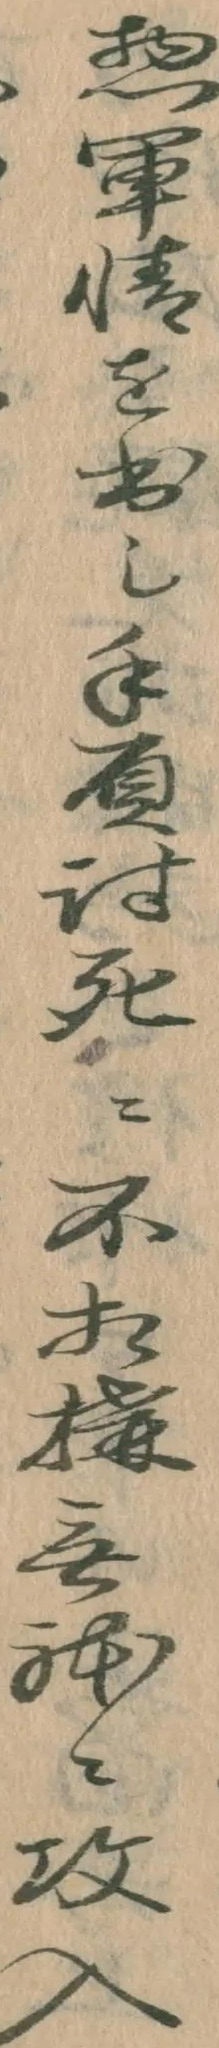惣軍情を出し手負討死に不相構無躰に攻入
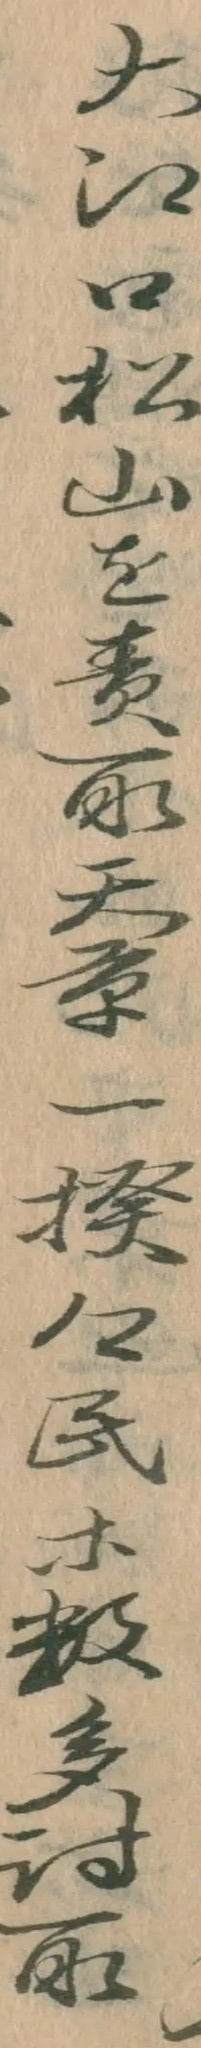大江口松山を責取天草一揆郷民等数多討取
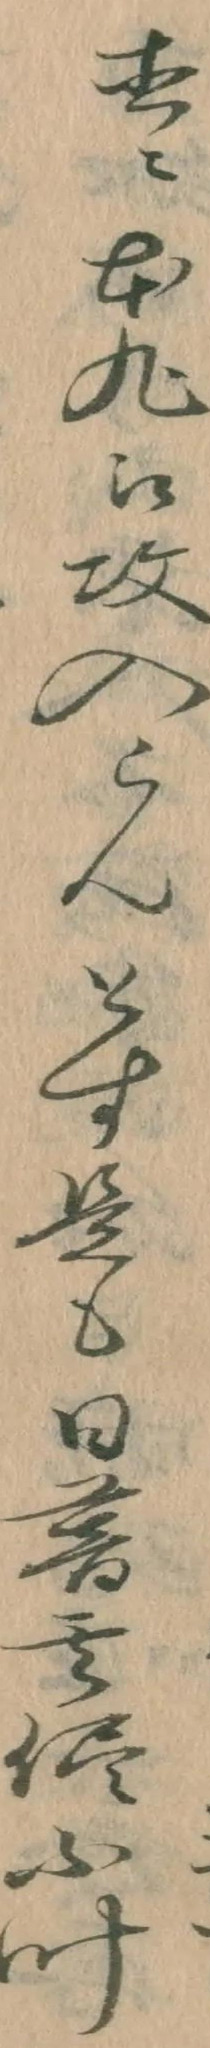直に本丸江攻入らんとす是も日暮其侭ふ叶
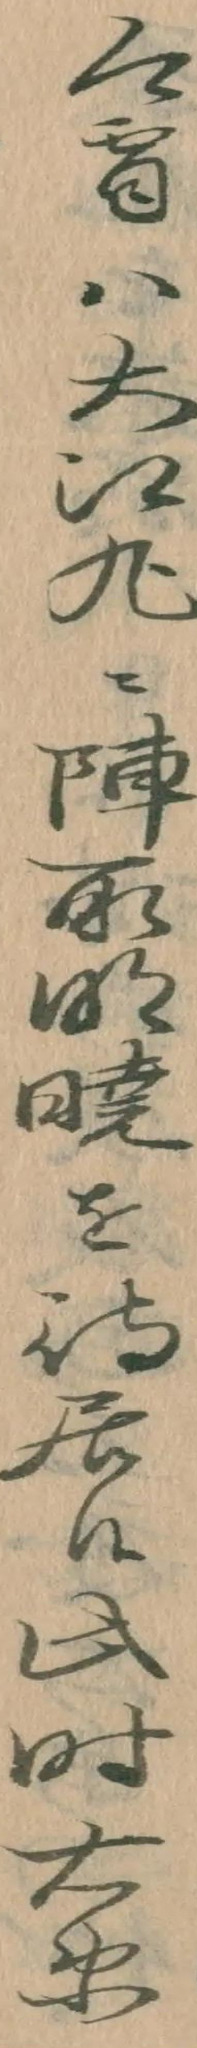今宵は大江丸に陣取明暁を待居候此時右衛
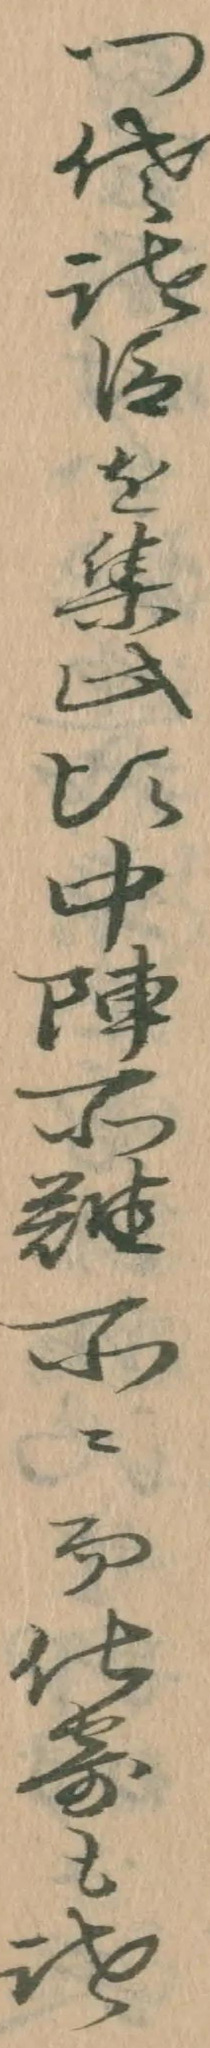門佐諸臣を集此頃中陣所難所に而仕寄も諸
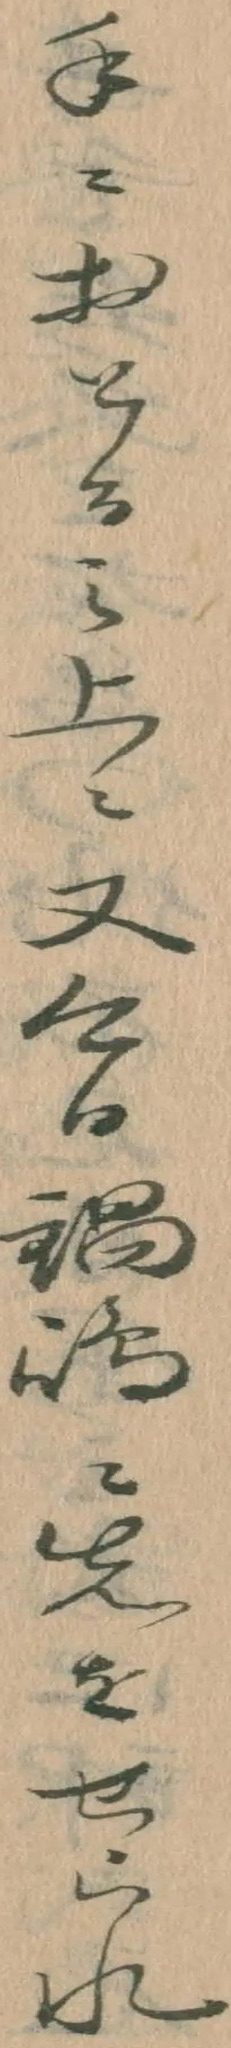手におとる之上に又今日鍋島に先をせられ
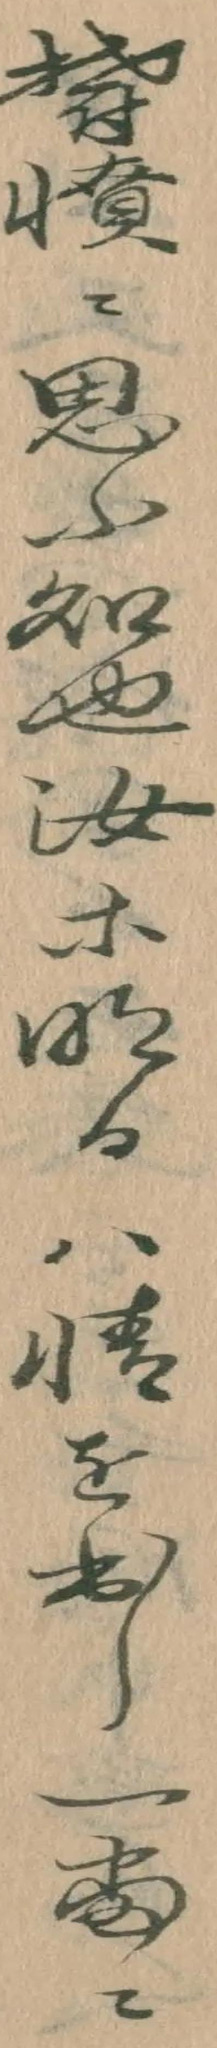欝憤に思ふ処也汝等明日は情を出し一番に
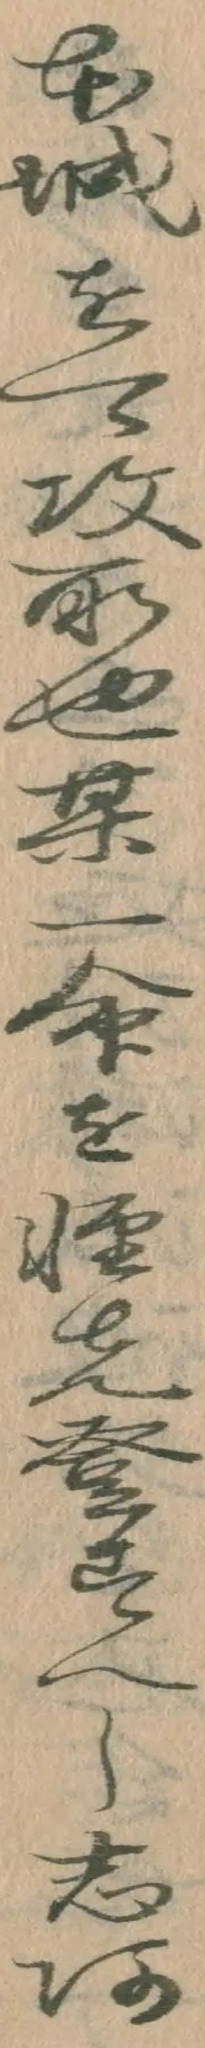本城を可攻取也某一命を軽先登春へし志阿
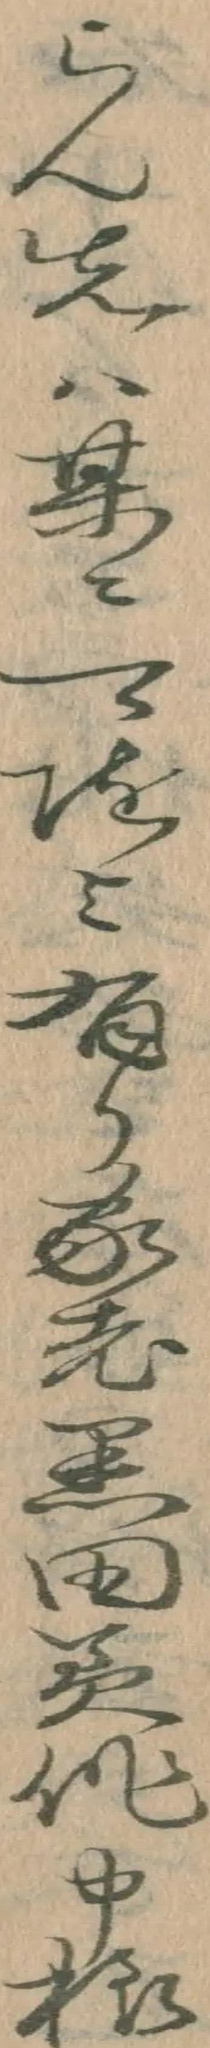らん先は某に可随与有り家老黒田美作申様
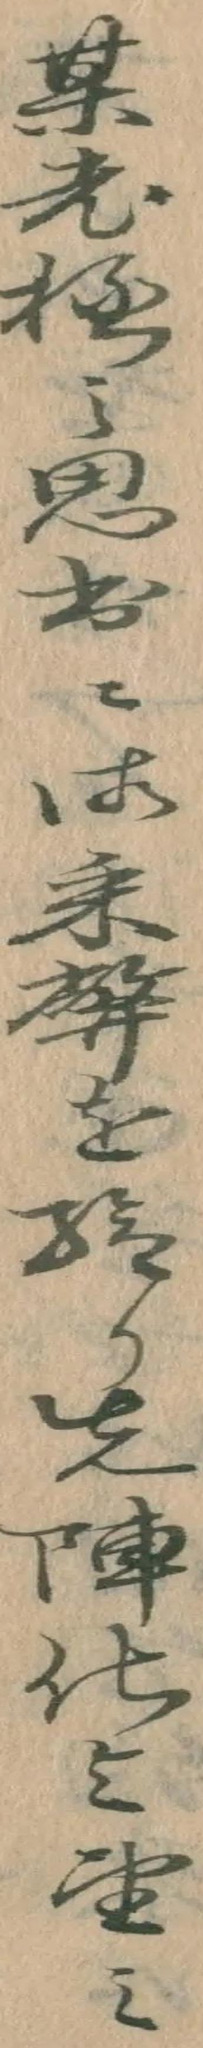某老極之思出に御采幣を給り先陣仕与望み
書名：切支丹御退治記 49巻. [7]
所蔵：国立国会図書館 National Diet Library, JAPAN
